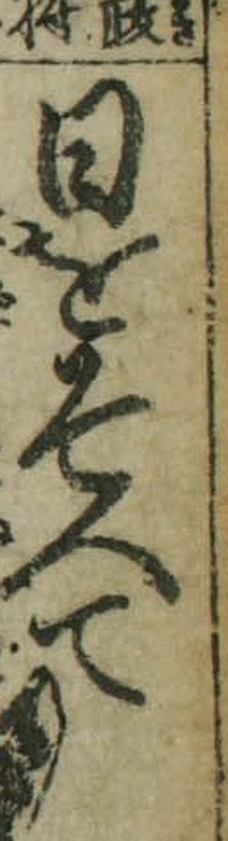日をそへて
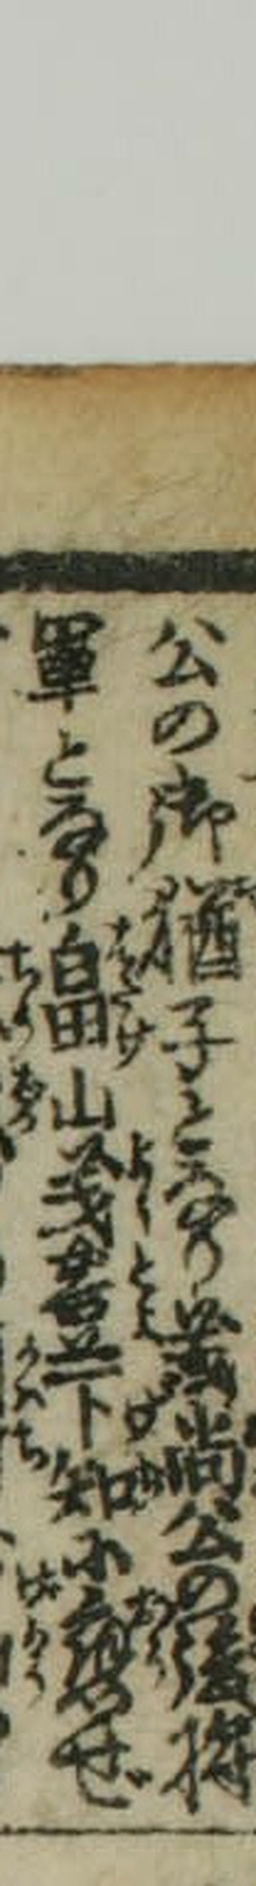軍となり畠山義豊下知に応ぜ
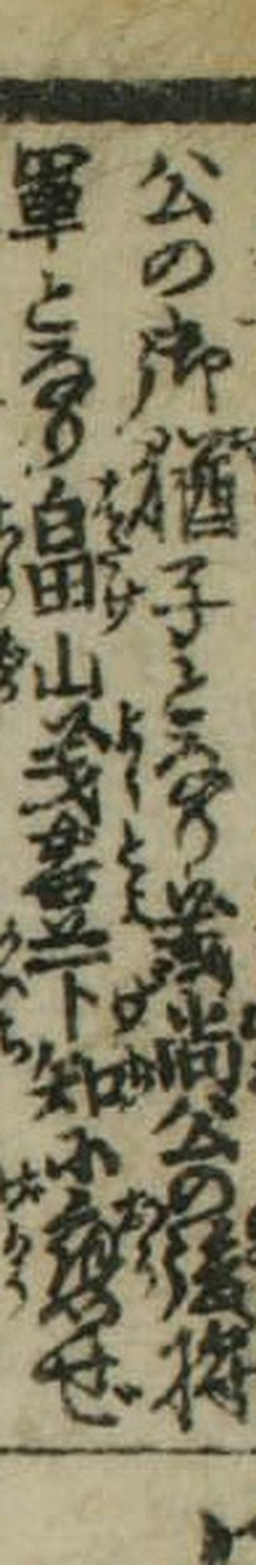軍となり畠山義豊下知に応ぜ
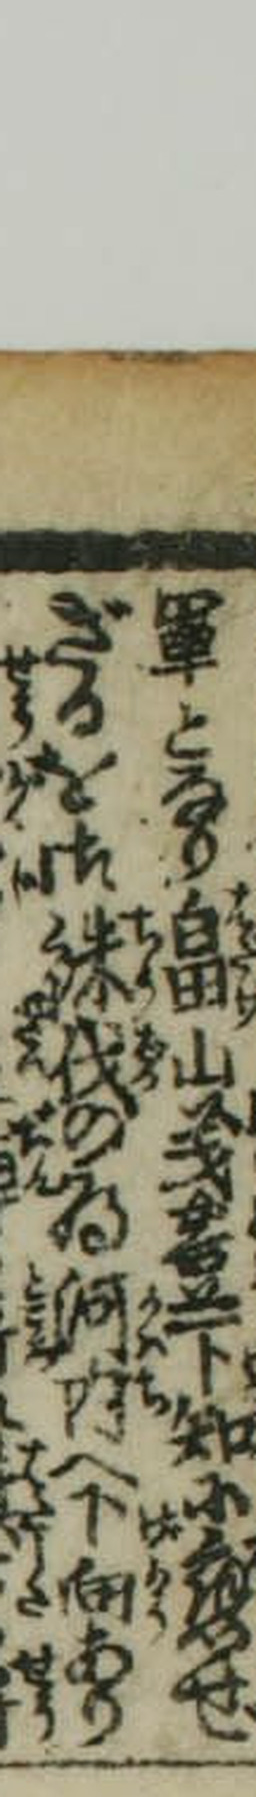ざるを御誅伐の為河内へ下向あり
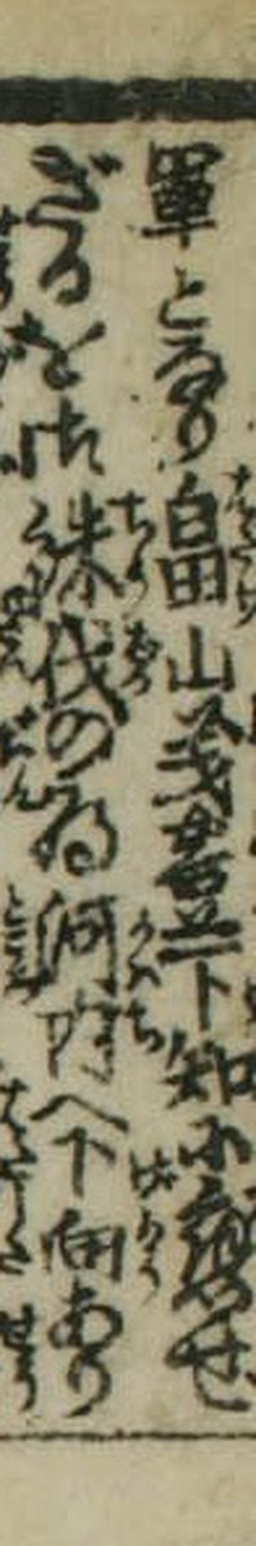ざるを御誅伐の為河内へ下向あり
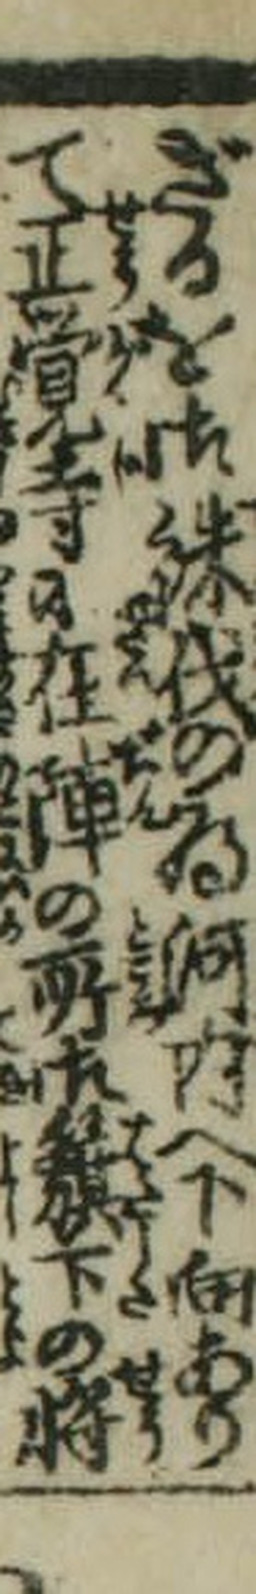て正覚寺に在陣の所古籏下の将
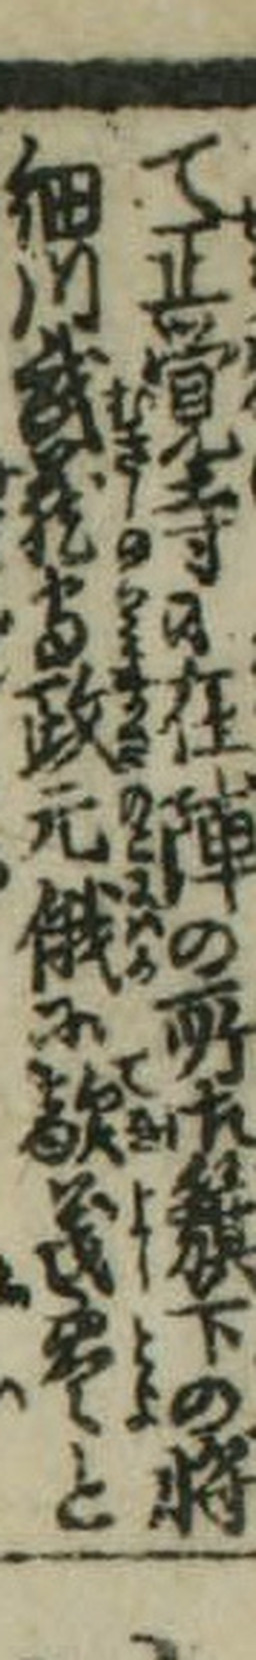細川武蔵守政元俄に敵義豊と
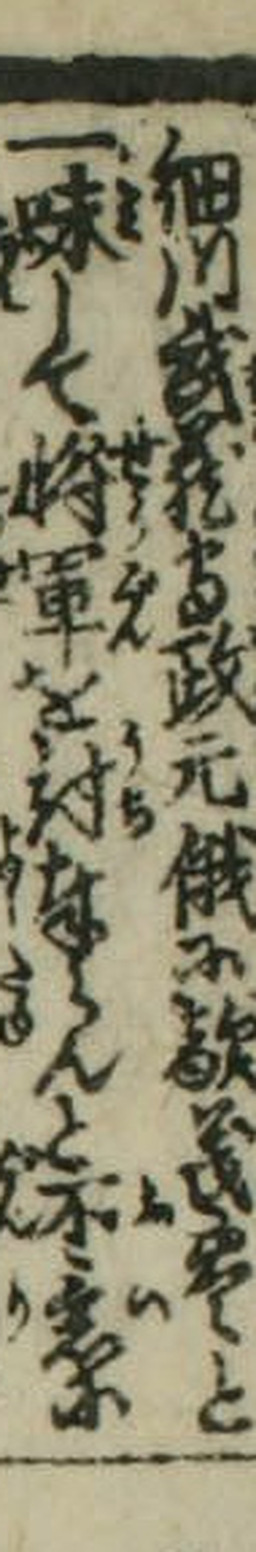一味して将軍を討奉らんと不意に
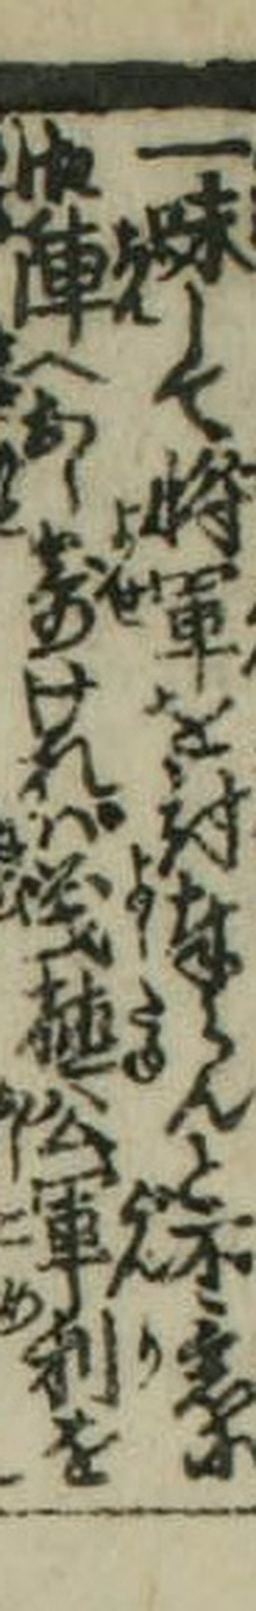御陣へおし寄ければ義植公軍利を
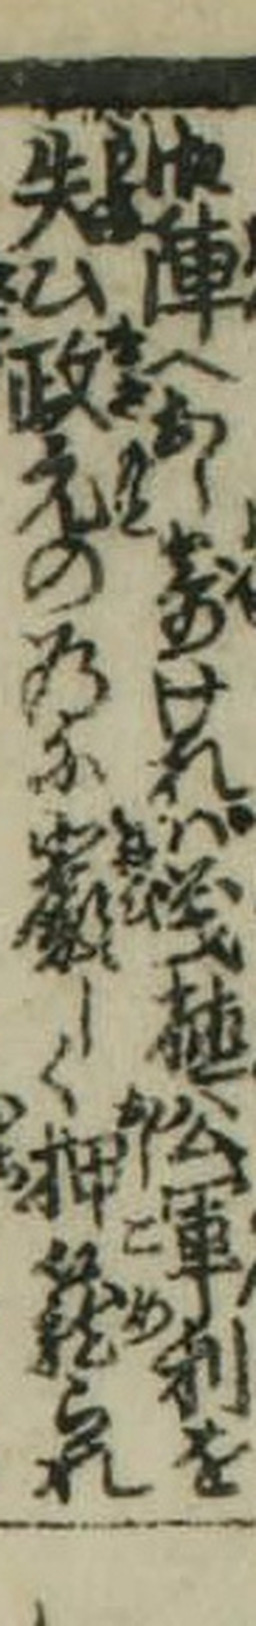失ひ政元の為に厳しく押籠られ
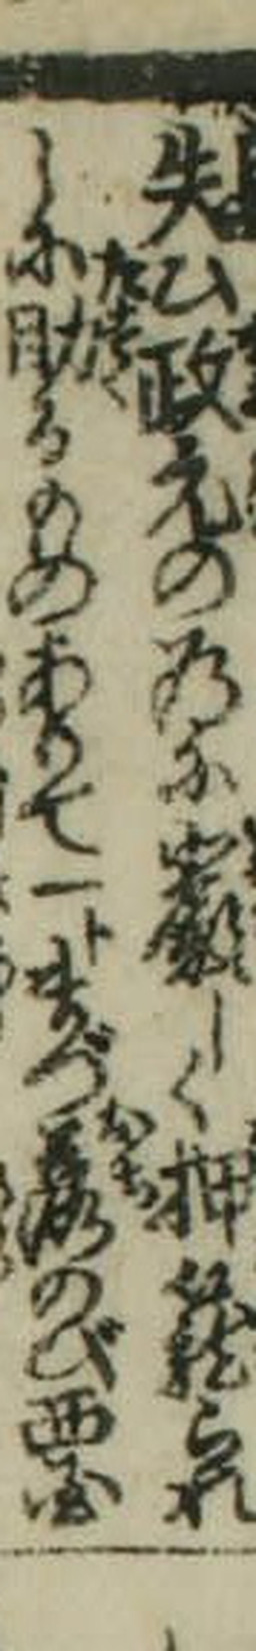しに助るものありて一ㇳまづ落のび西国
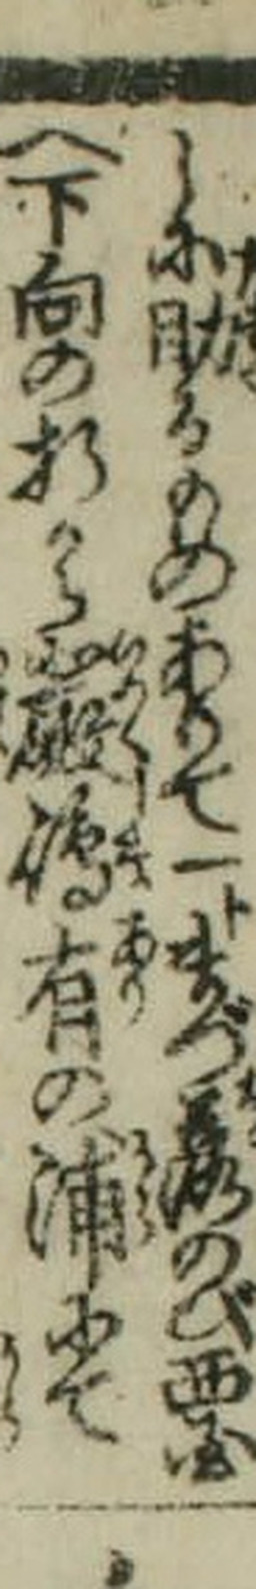へ下向の折から厳嶋有の浦にて
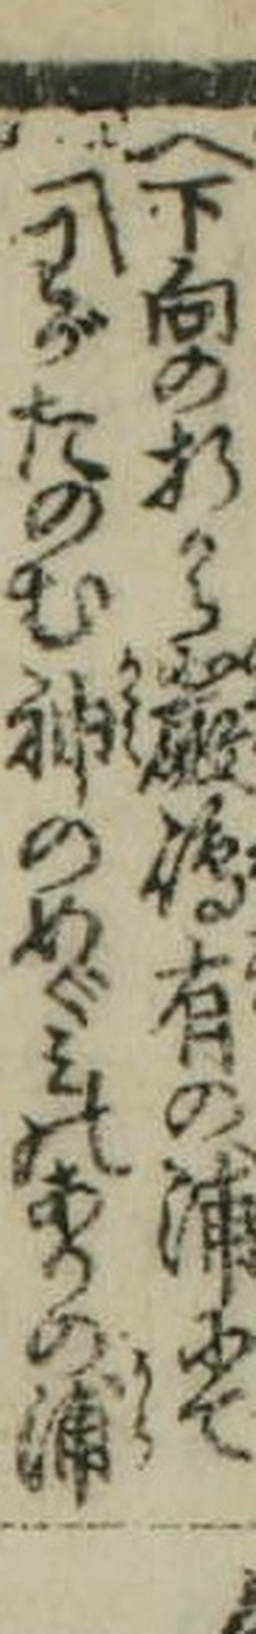〽わがたのむ神のめぐみのありの浦
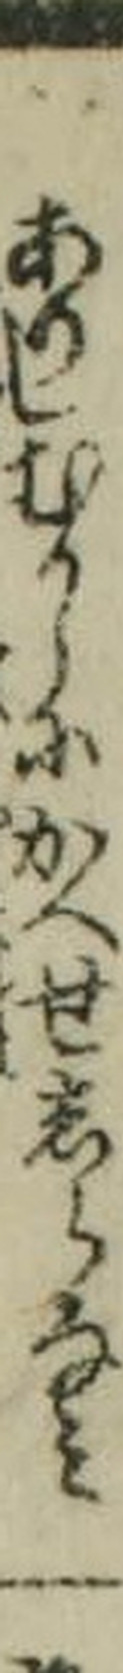ありしむかしにかへせしらなみ
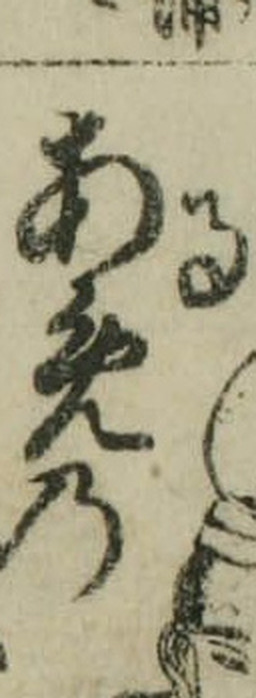あめの
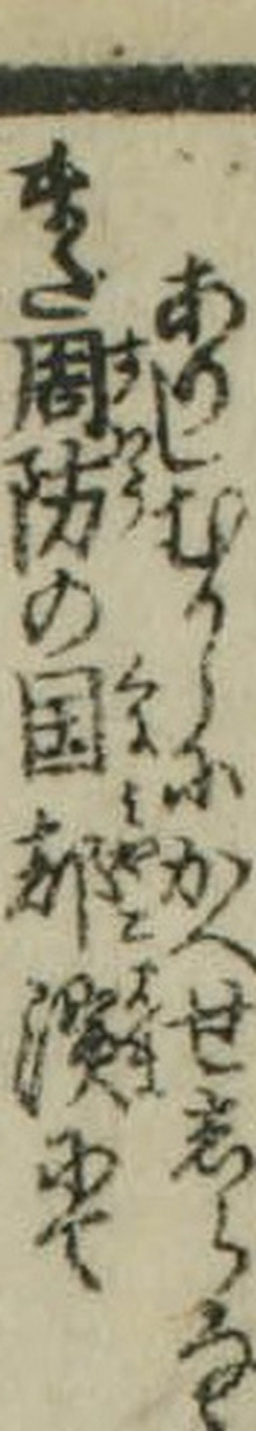また周防の国都浜にて
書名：續英雄百人一首
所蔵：東京学芸大学附属図書館
